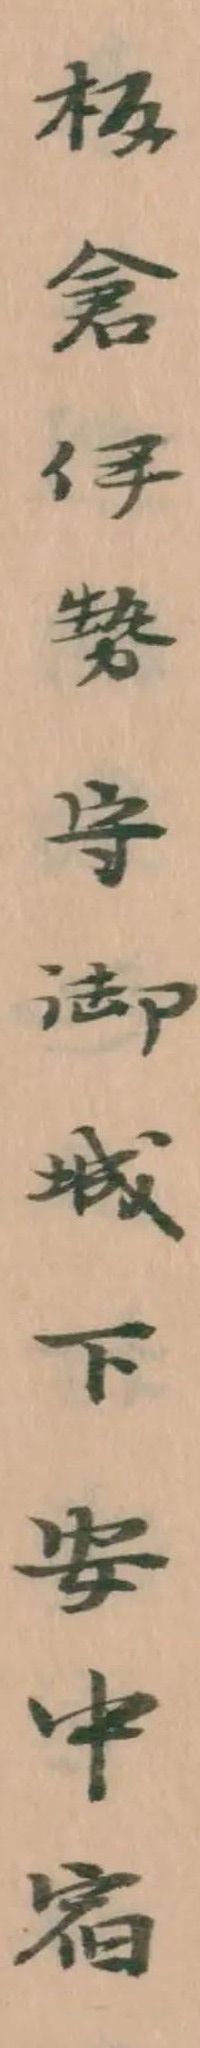板倉伊勢守御城下安中宿
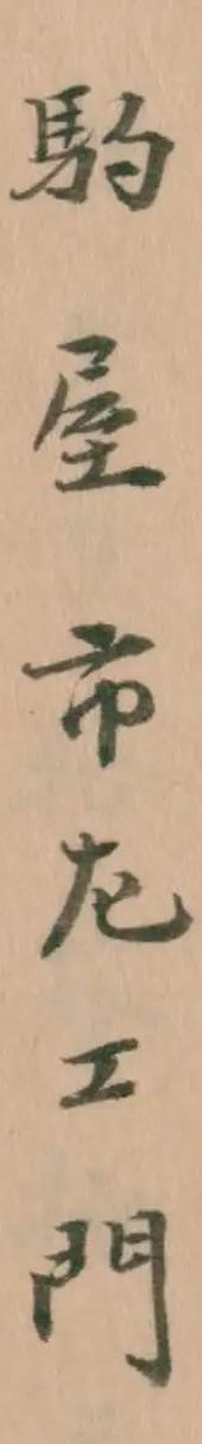駒屋市左衛門
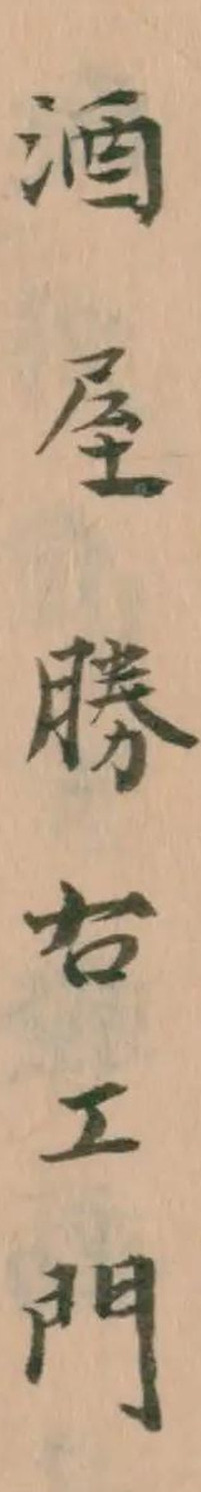酒屋勝右衛門
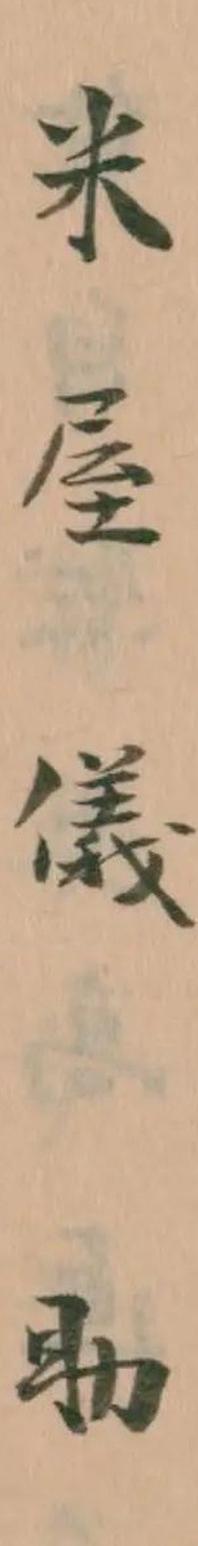米屋儀助
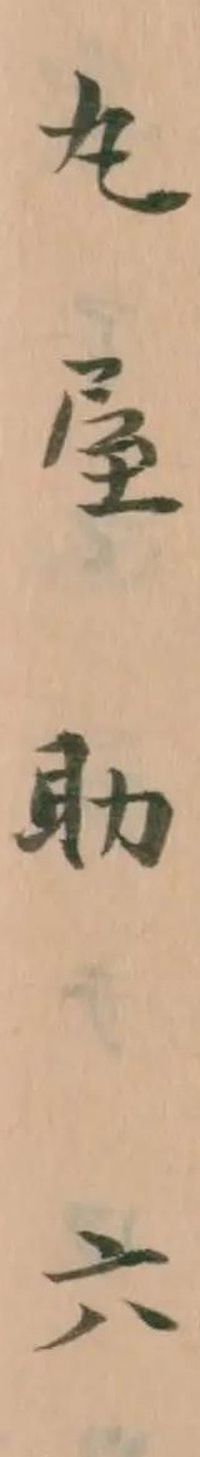丸屋助六
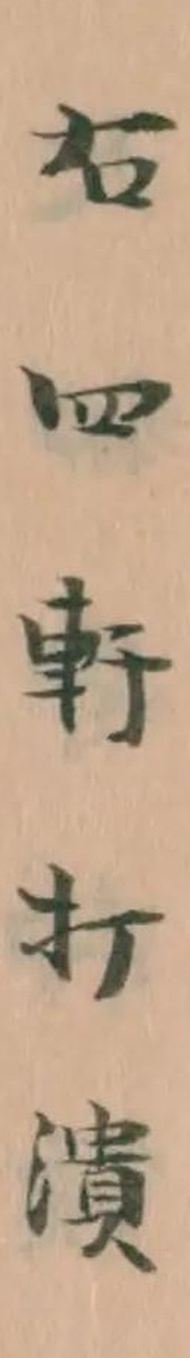右三軒打潰
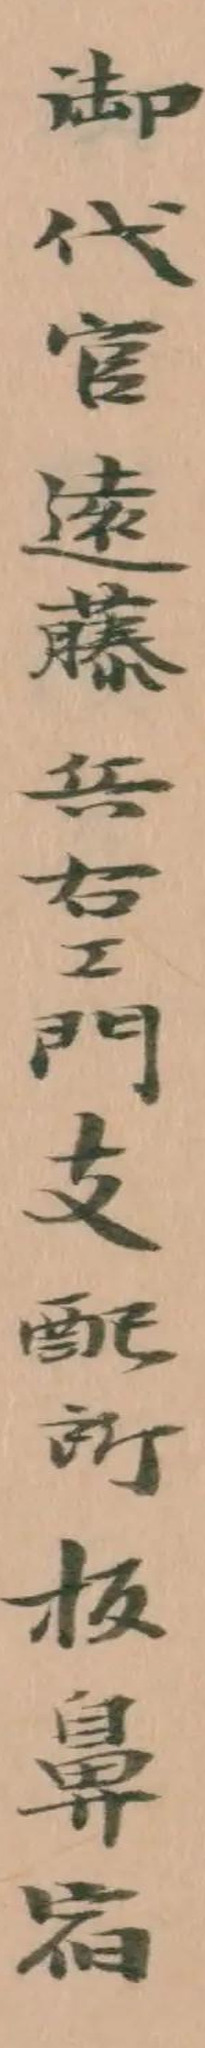御代官遠藤兵右衛門支配所板鼻宿
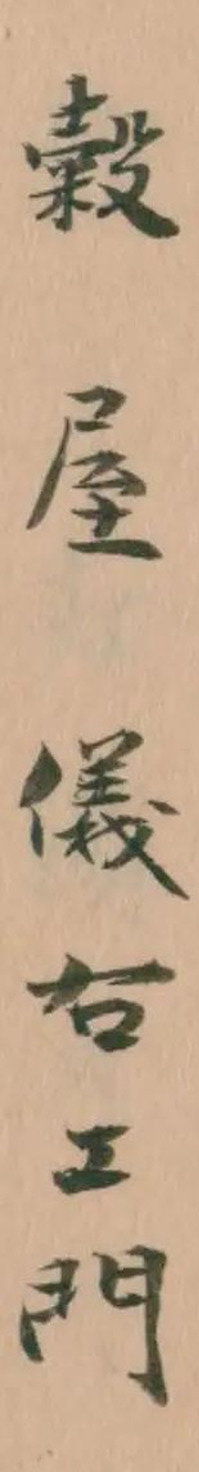穀屋儀右衛門
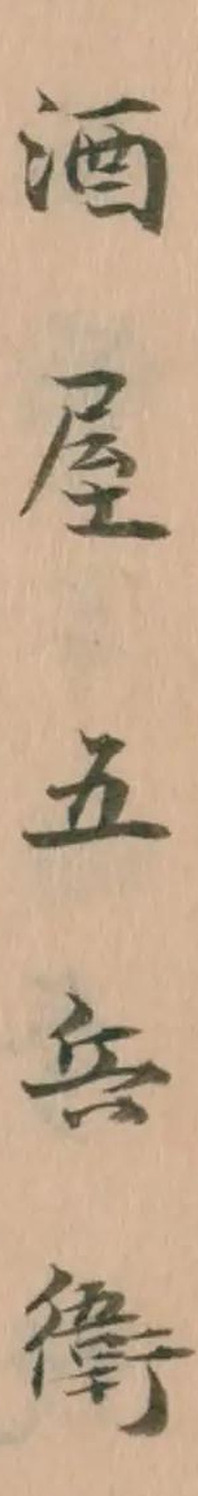酒屋五兵衛
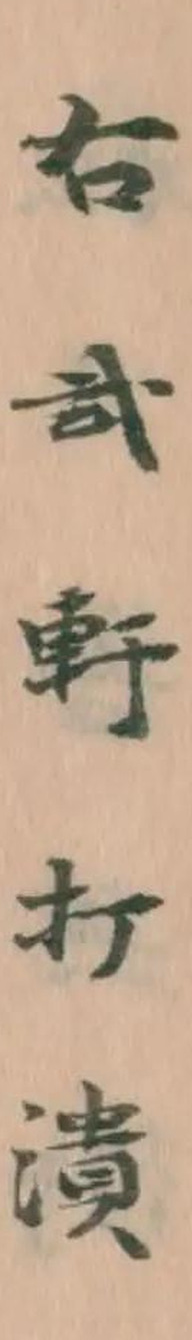右弐軒打潰
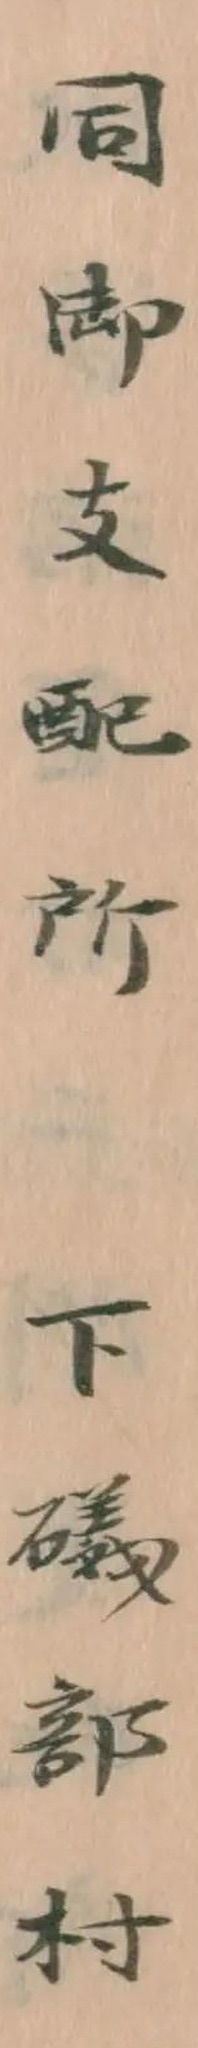同御支配所下磯部村
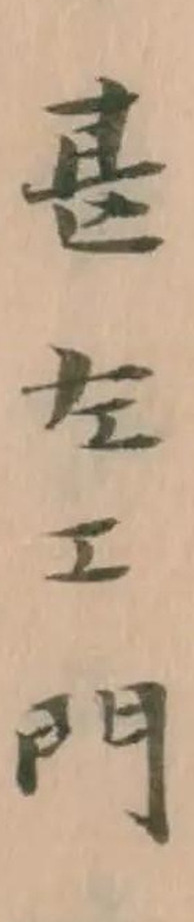甚左衛門
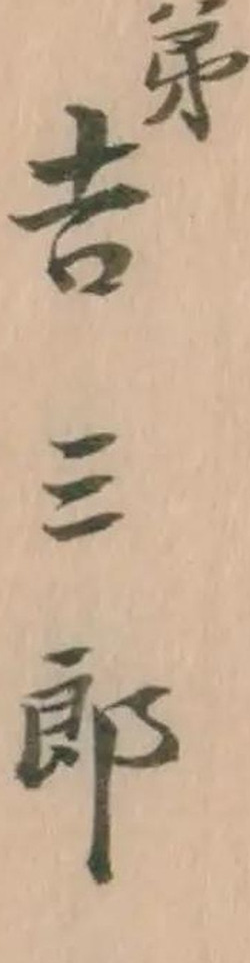弟吉三郎
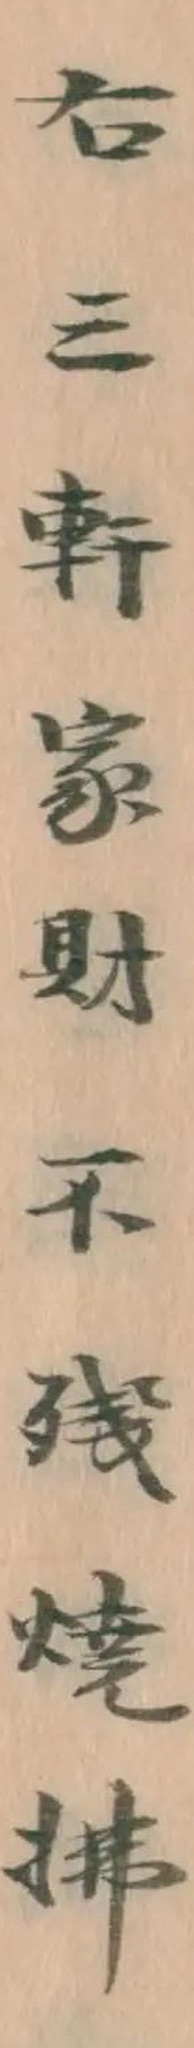右三軒家財不残焼払

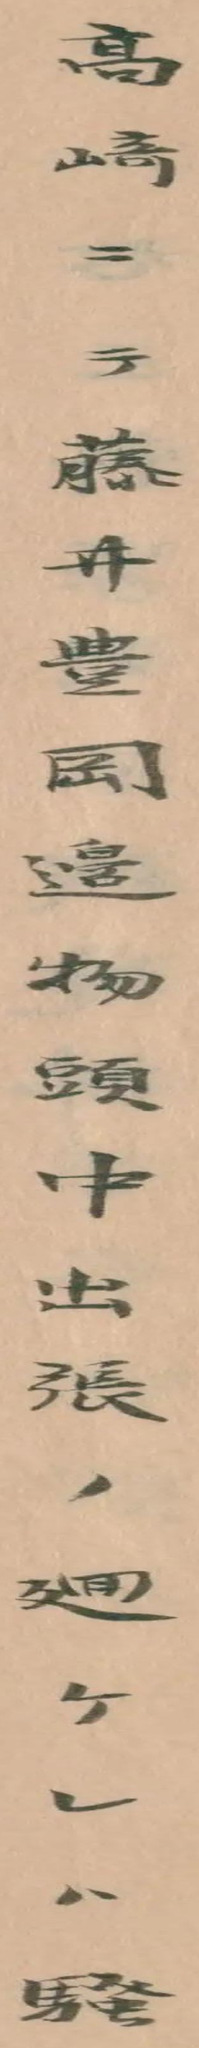高崎ニテ藤井豊岡辺者頭中出張ノ廻ケレハ騒
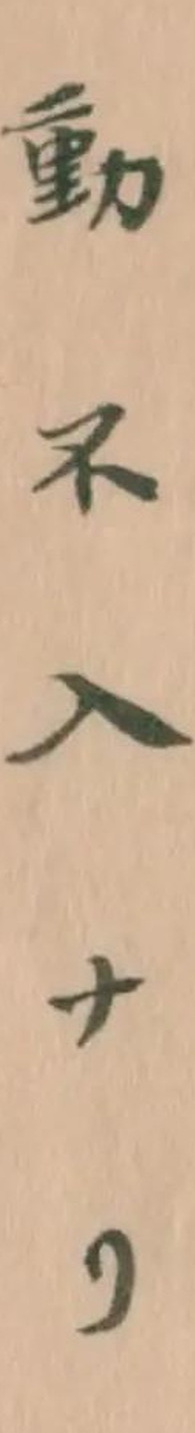動不入ナリ
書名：地災撮要. 巻3(地震之部)-巻4(噴火之部)
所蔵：国立国会図書館 National Diet Library, JAPAN
